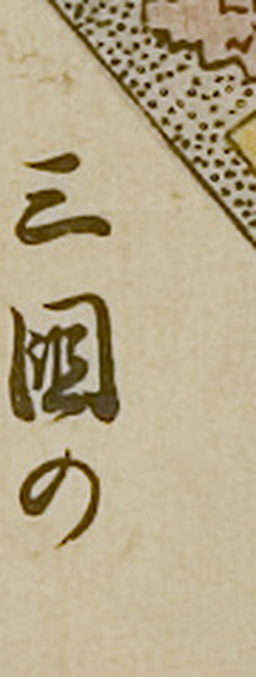三国の
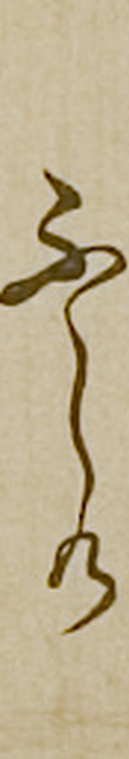ふしの
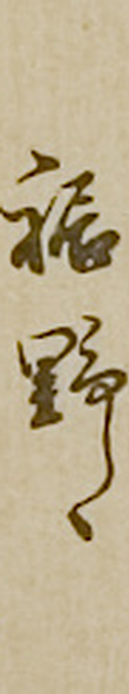裾野ゝ
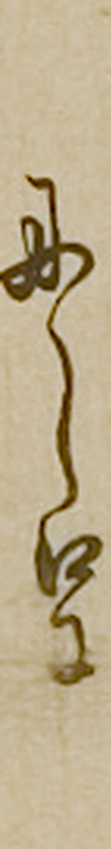にし郷に
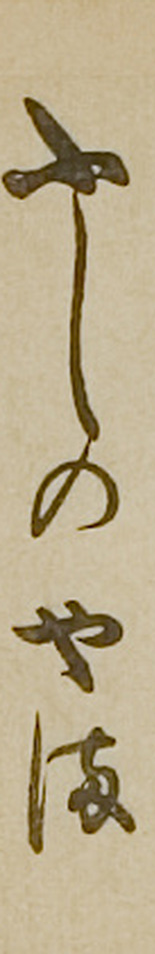ふしのやま
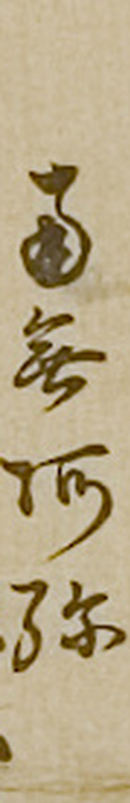南無阿弥
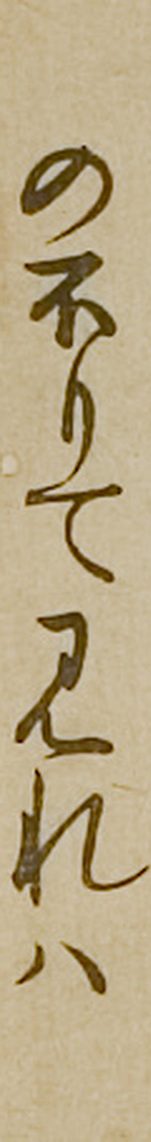のほりて見れは
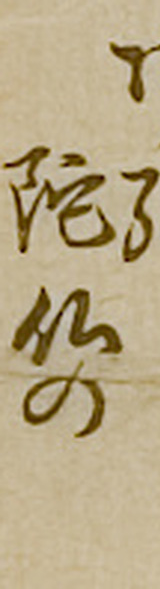陀仏の
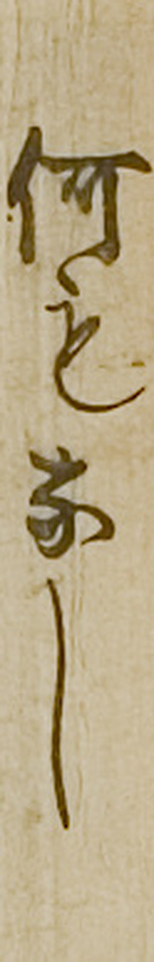何もなし
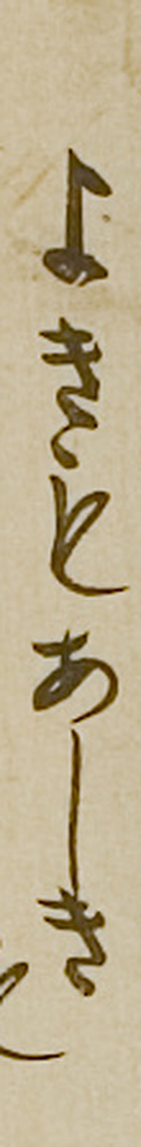よきもあしきも
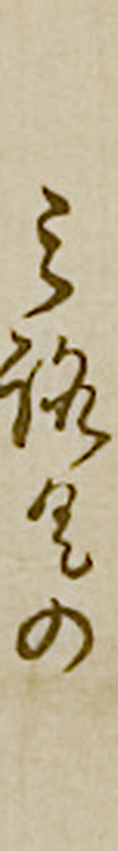みろくの
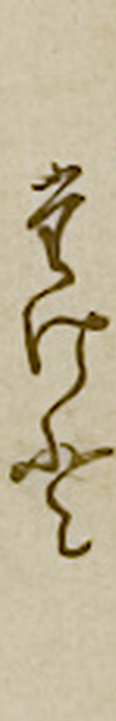たけと
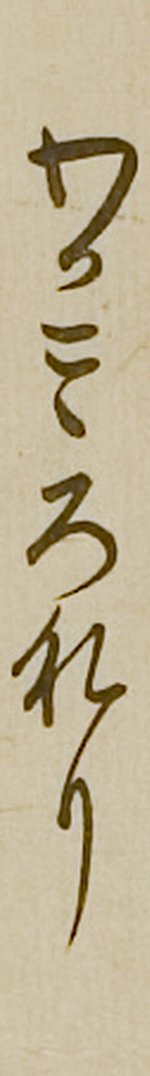わかこゝろなり
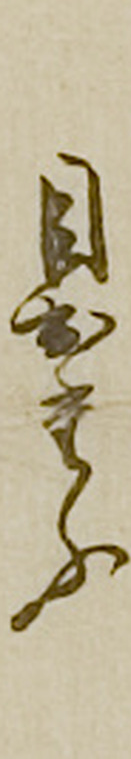目出たふ
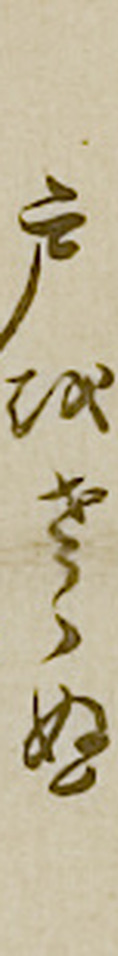戸をさらぬ

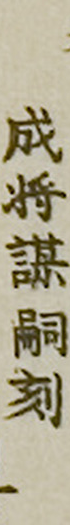成将謀嗣刻
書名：[富士山図]
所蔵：東京大学総合図書館 General Library in the University of Tokyo, JAPAN
